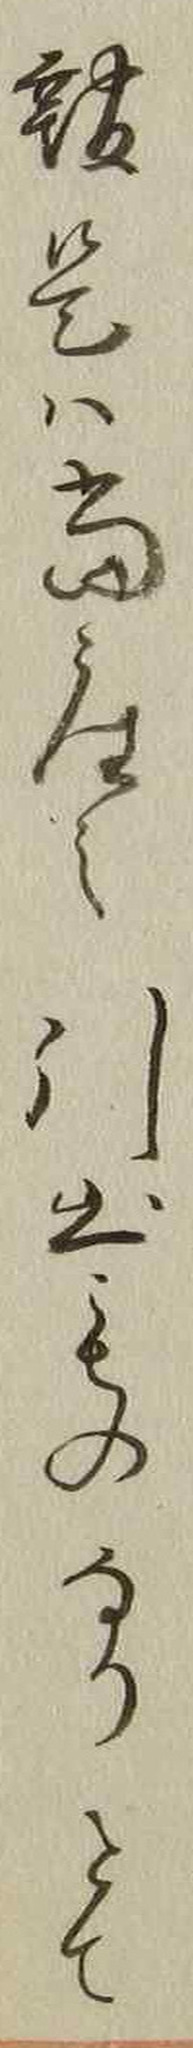報是ハ当産之引出ものなりとて
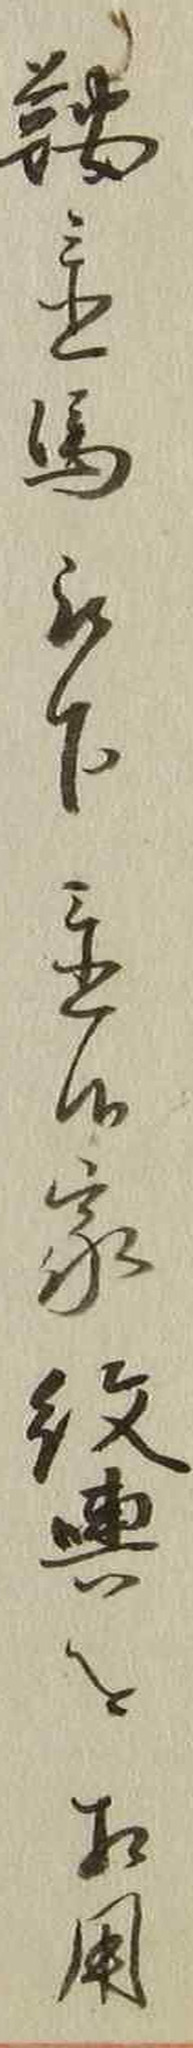鞍置馬被下置候家紋輿を相用
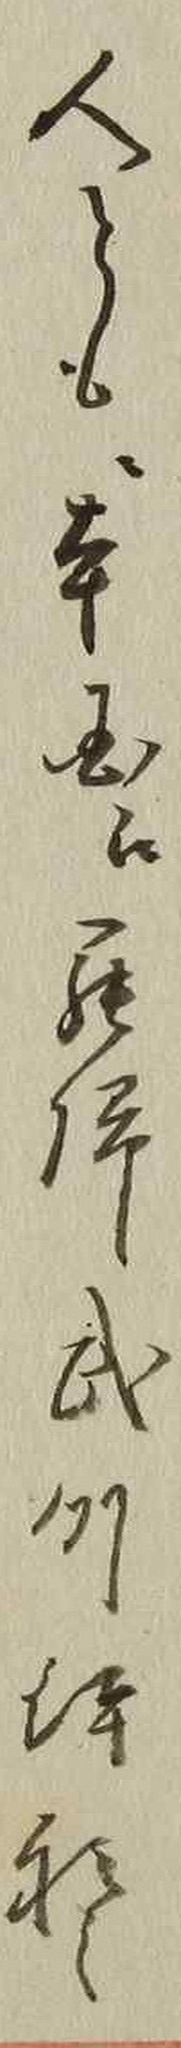人ともニ本国江罷帰武州鉢形之
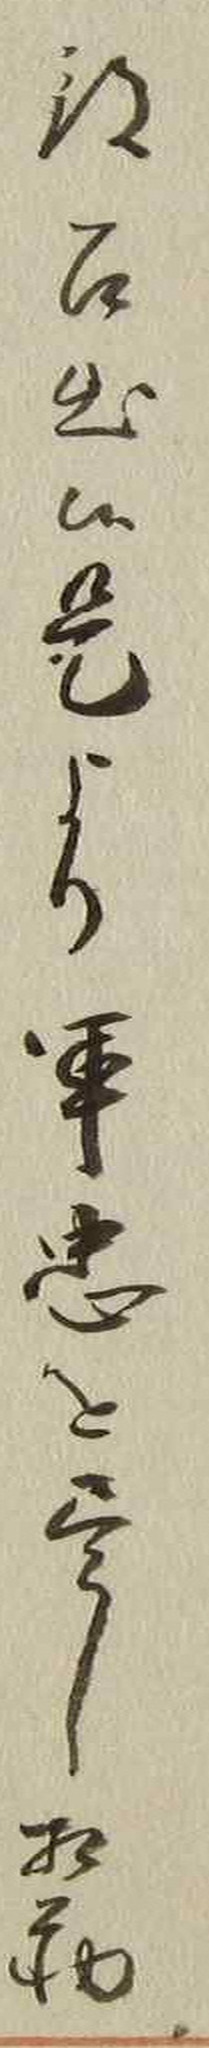被召出候是より軍忠を尽し相勤
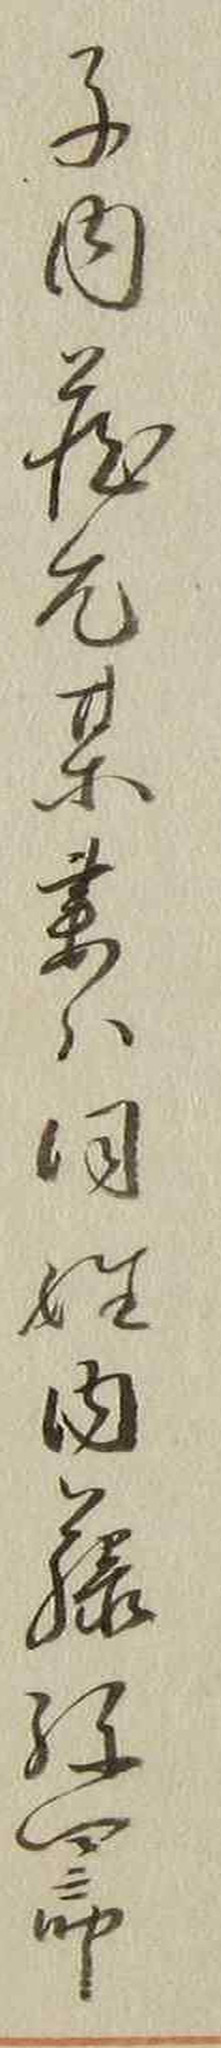子内蔵允某妻ハ同姓内藤弥四郎
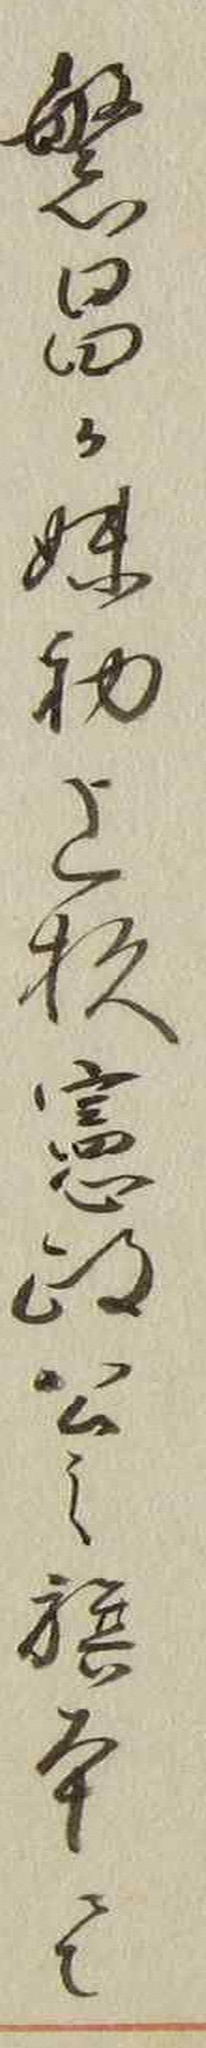繁昌か妹初上杉憲政公之旗本ニて
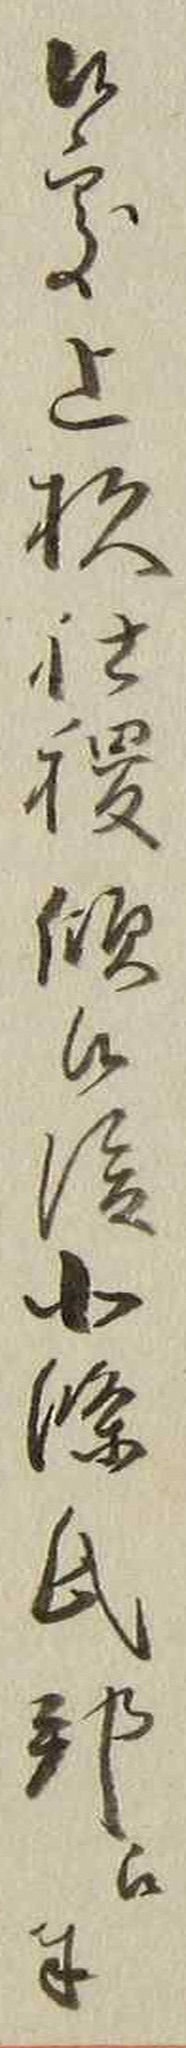候処上杉社稷傾候後北条氏邦江奉
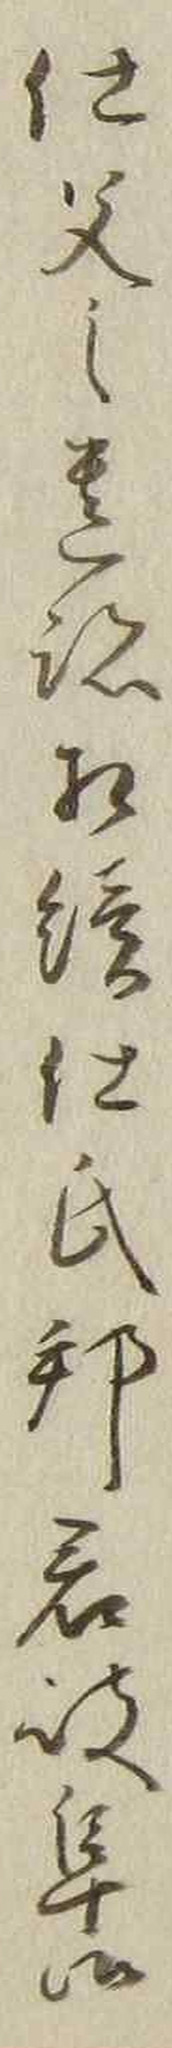仕父之遺跡相続仕氏邦君岐阜御
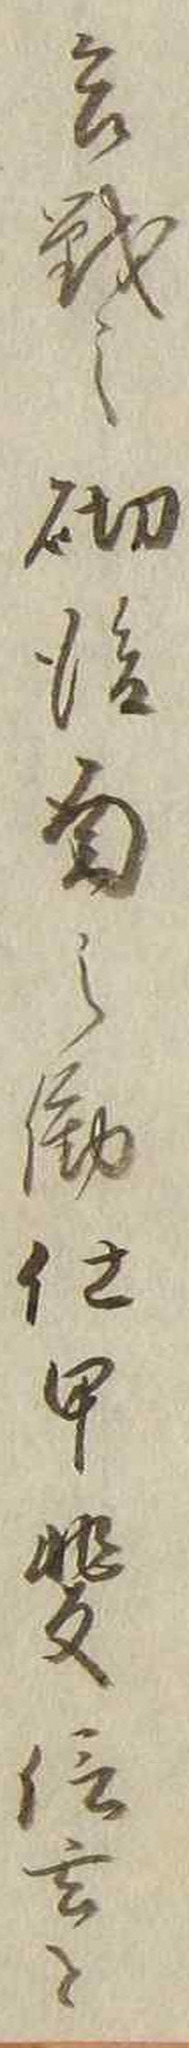会戦之砌後殿之働仕甲斐信玄と

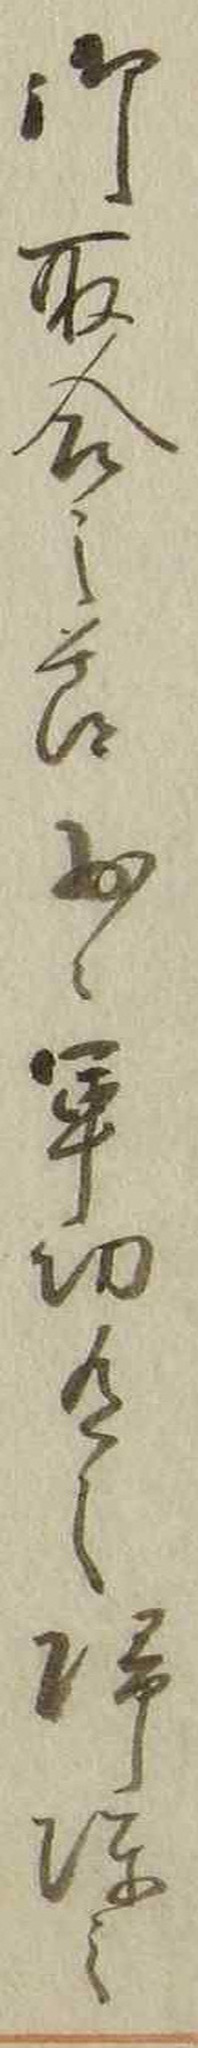御取合之節少々軍功有之帰陣之
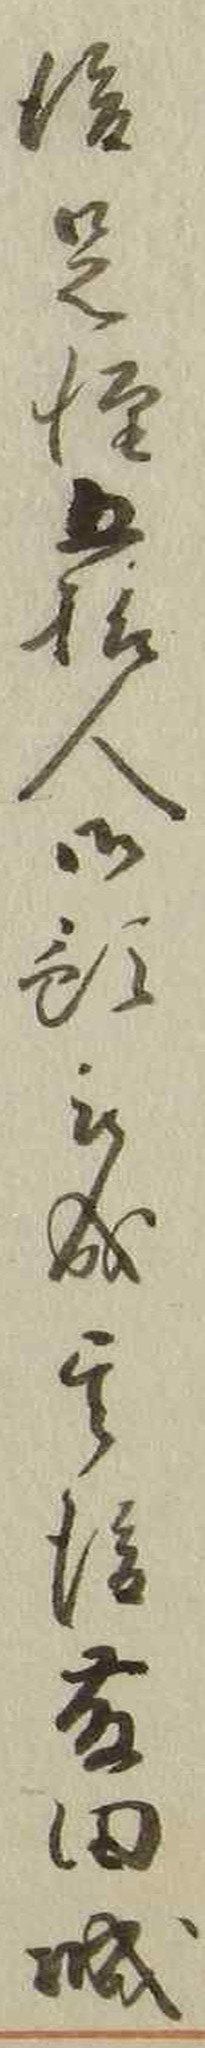後足軽五拾人御預被成其後藤田城
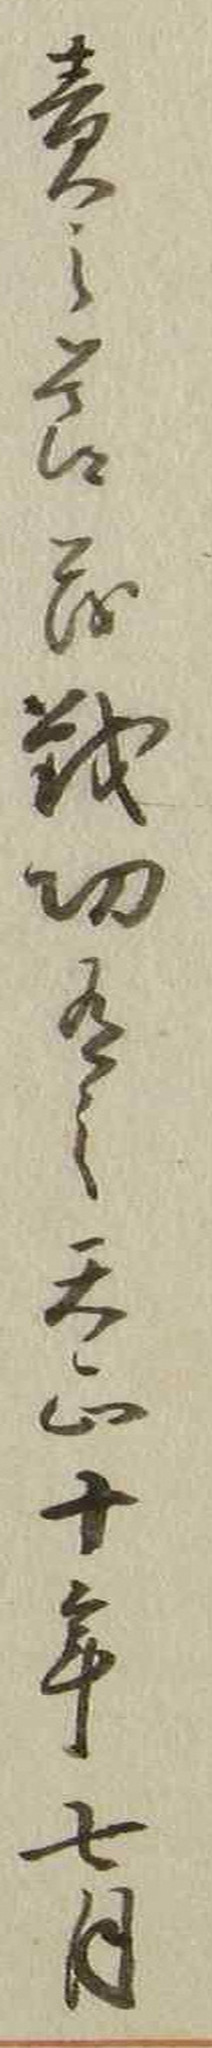責之節も戦功有之天正十年七月
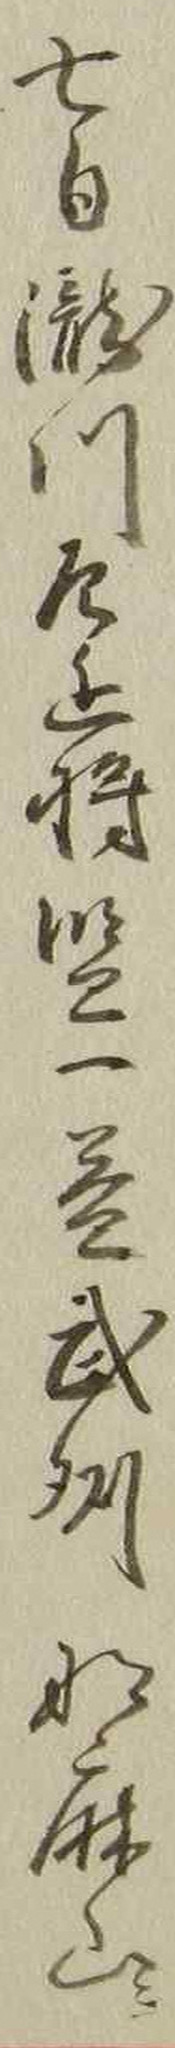七日滝川左近将監一益武州那麻山ニ
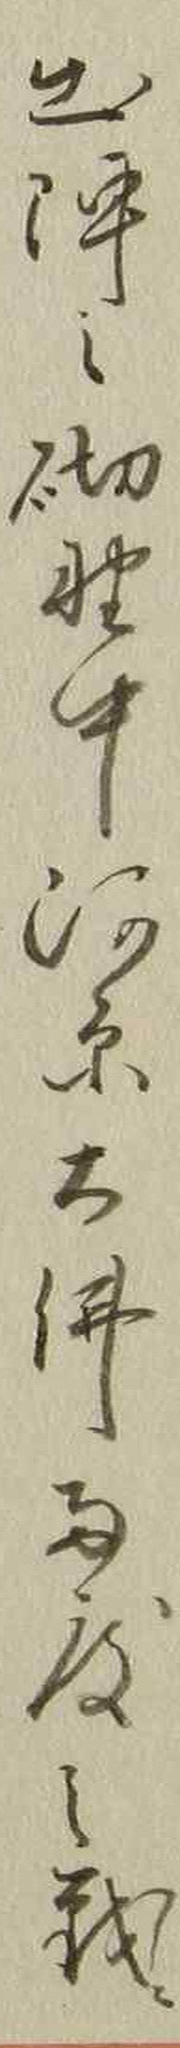出陣之砌野中河原大仏両度之戦ニ
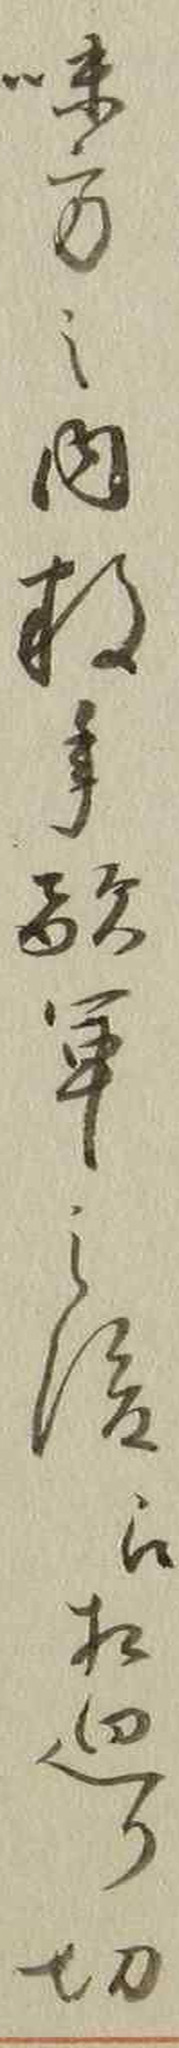味方之内数手敵軍之後江相廻り切
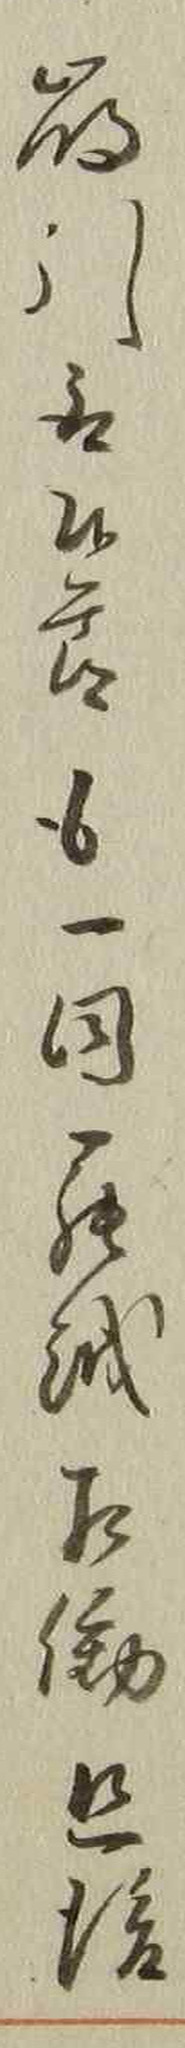崩引取候節も一同罷越相働且後
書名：諸士系譜　巻之122　よ之部5
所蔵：会津若松市立会津図書館
